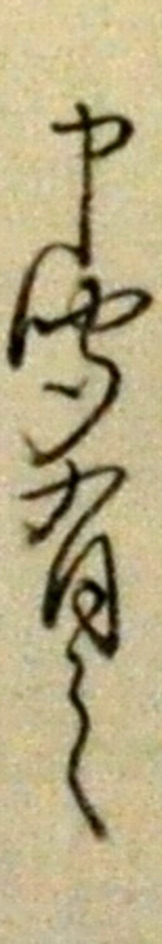申聞有之
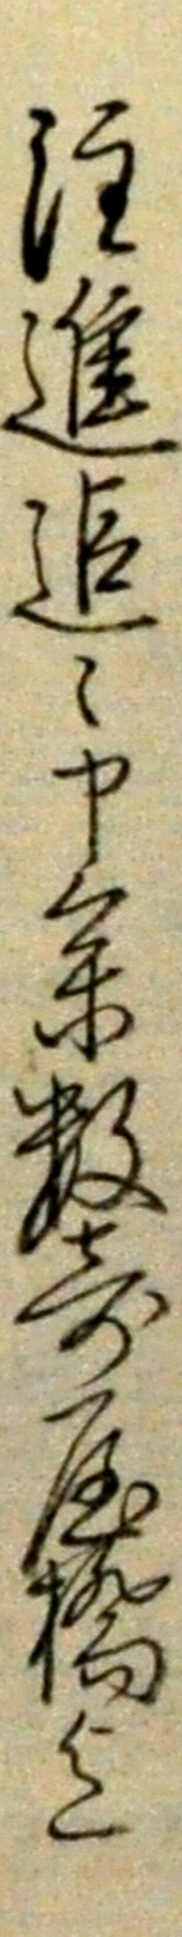注進追々申参数寄屋橋迄
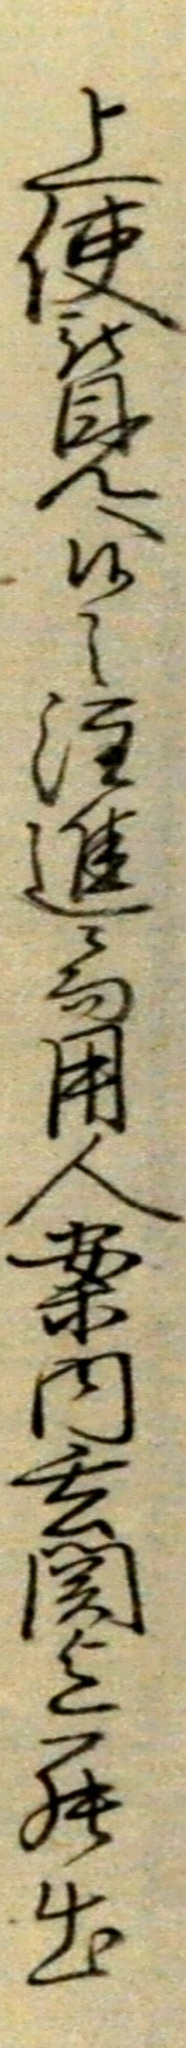上使被見へ候之注進ニ而用人案内玄関迄罷出
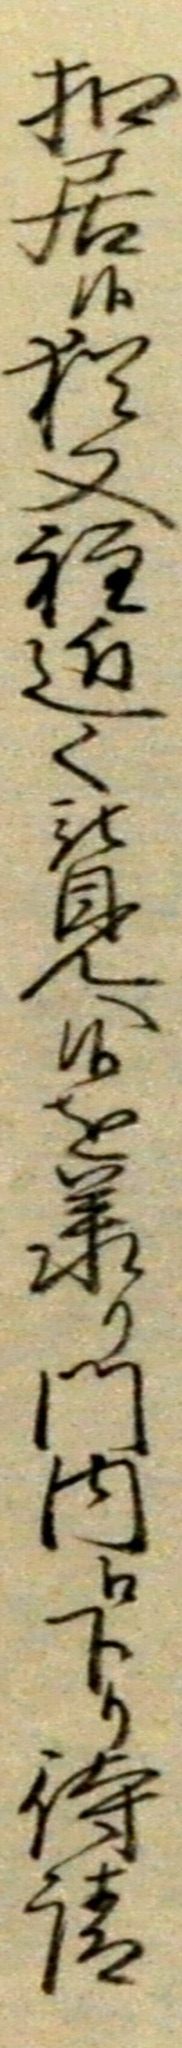扣居候猶又程近く被見へ候を承り門内え下り待請
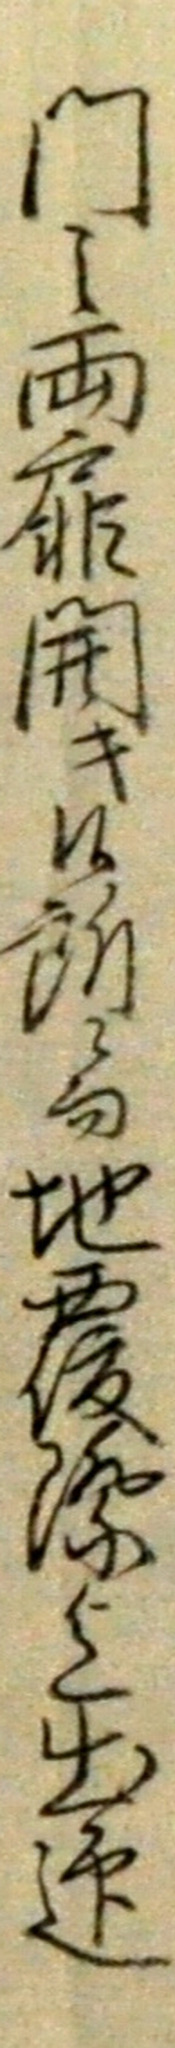門之両扉開キ候所ニ而地覆際迄出迎
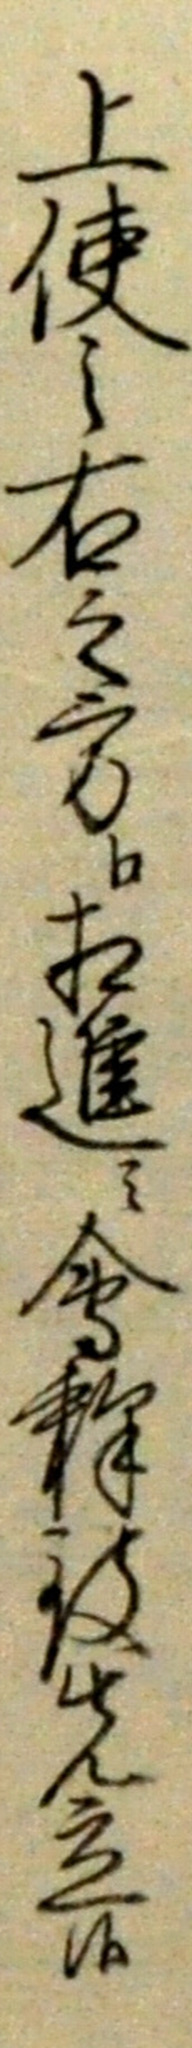上使之右之方え相進ミ会釈致先立候

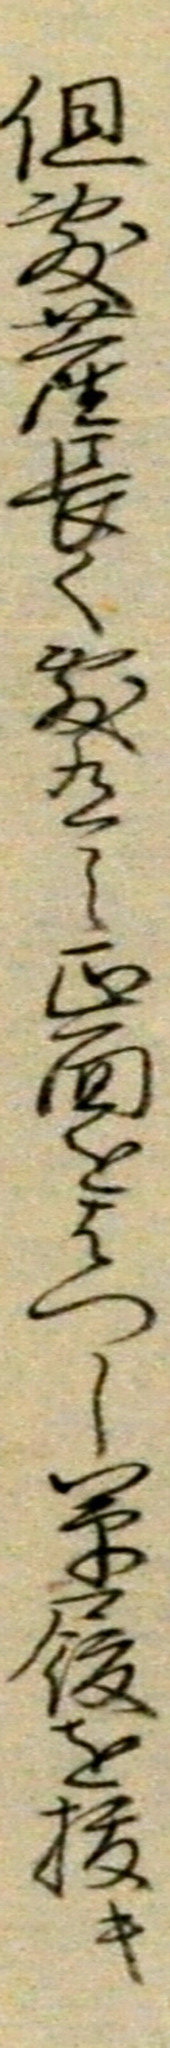但敷蓙長く敷有之正面をはつし草履を抜キ
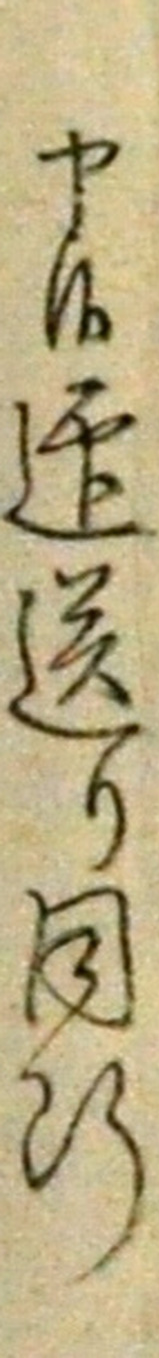申候迎送り同断
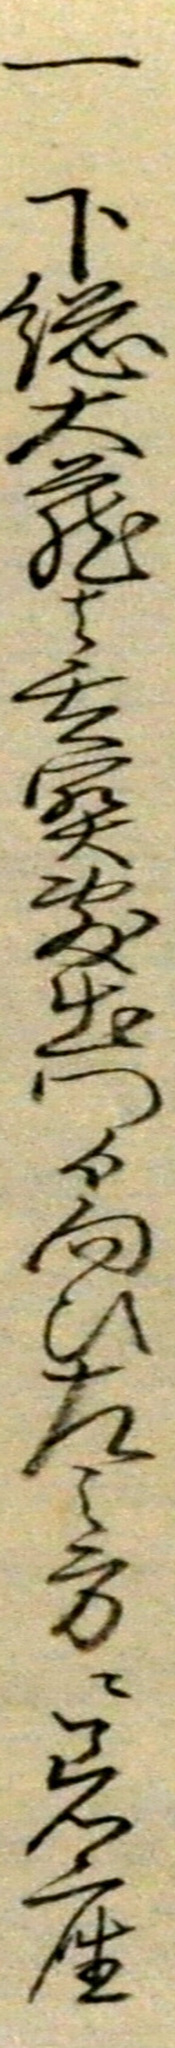一下総大蔵は玄関敷出門ゟ向ひ左之方ニ着座
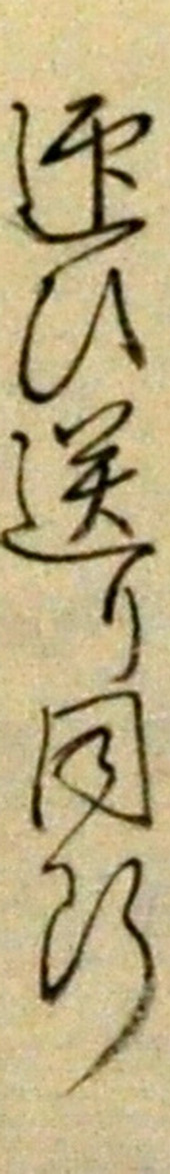迎ひ送り同断
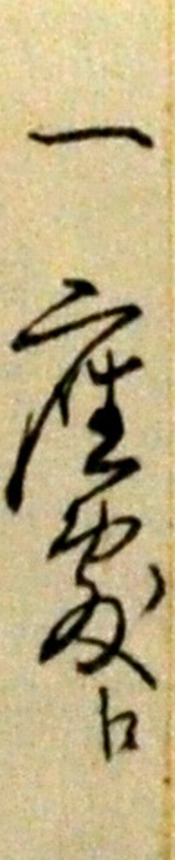一座敷え
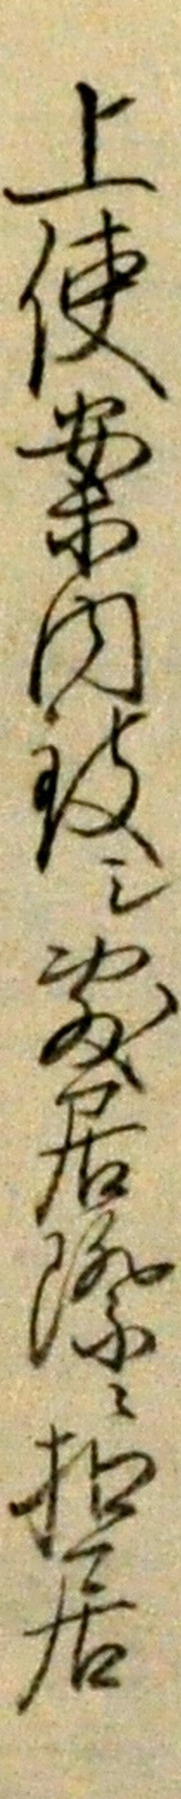上使案内致シ敷居際ニ扣居
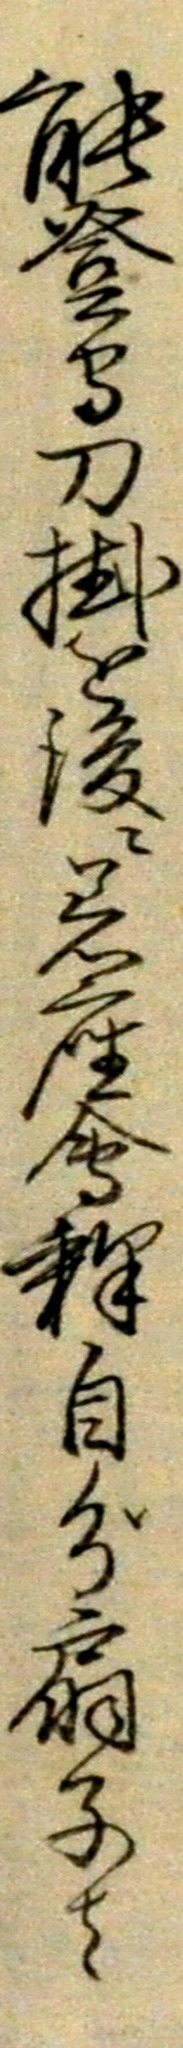能登守刀掛を後ニ着座会釈自分扇子を
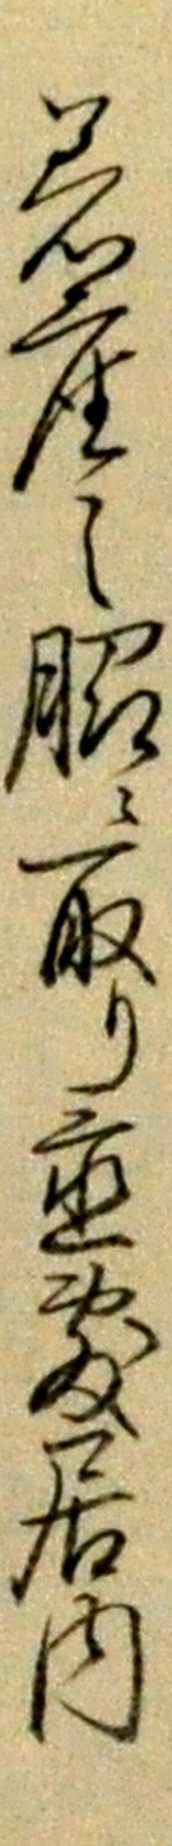着座之脇ニ取り置敷居内
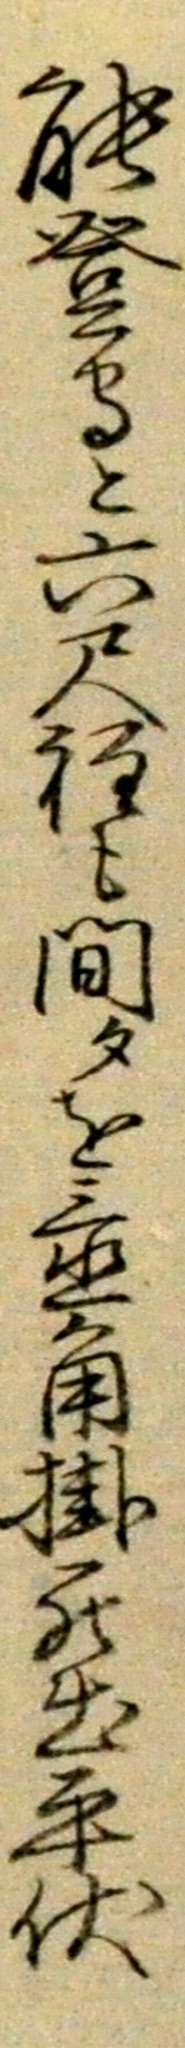能登守と六尺程も間タを置角掛罷出平伏
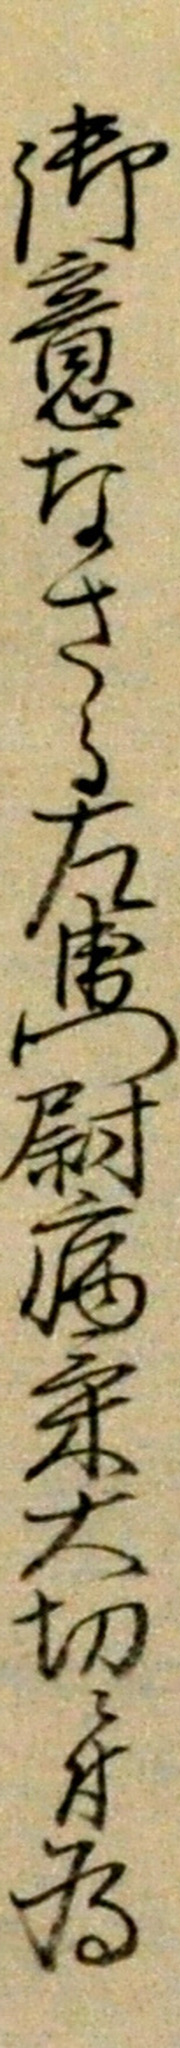御意なさる左衛門尉病気大切ニ付為
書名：上使仰付ラレ候節ノ留外
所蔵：伊那市立高遠町図書館・合同会社AMANE
